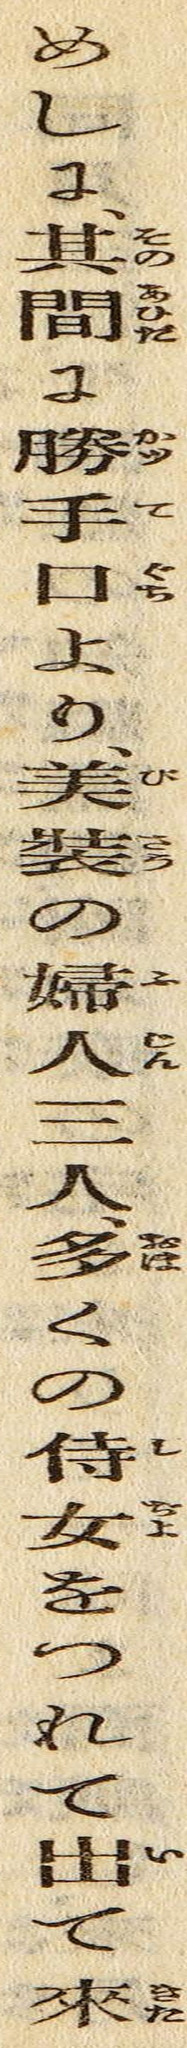めしに、其間に勝手口より、美装の婦人三人、多くの侍女をつれて出て來
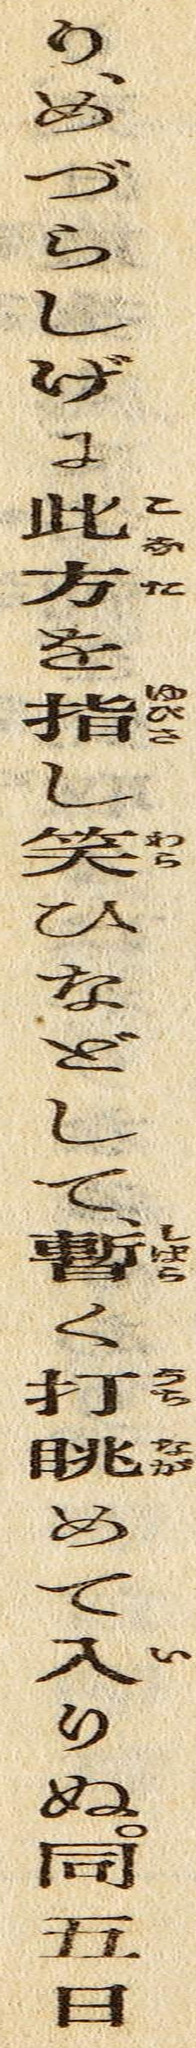り、めづらしげに此方を指し笑ひヽなどして暫く打眺めて入りぬ。同五日
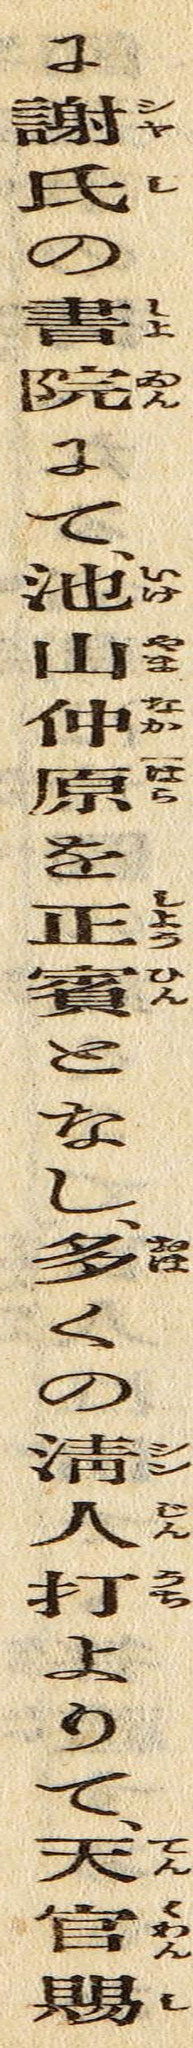に謝氏の書院にて池山仲原を正賓となして、多くの清人打よりて、天官賜
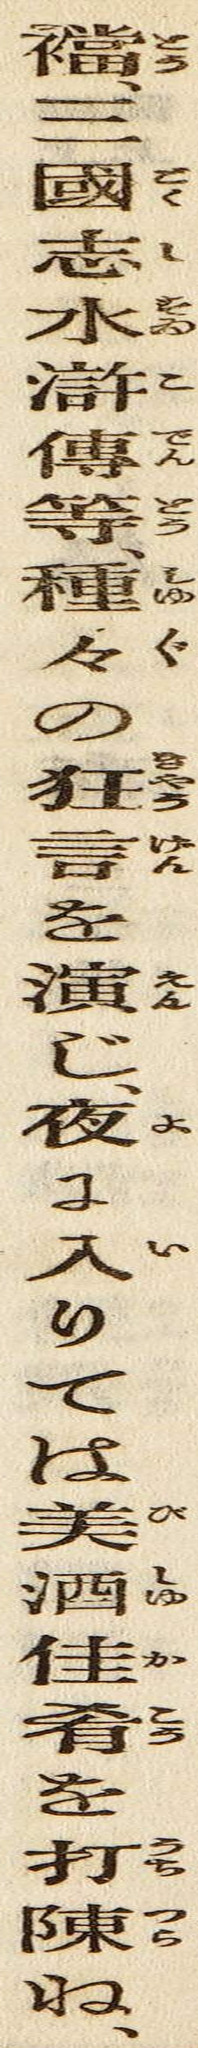襠、三國志水滸伝等、種々〴〵の狂言を演じ、夜に入りては美酒佳肴を打陳ね、
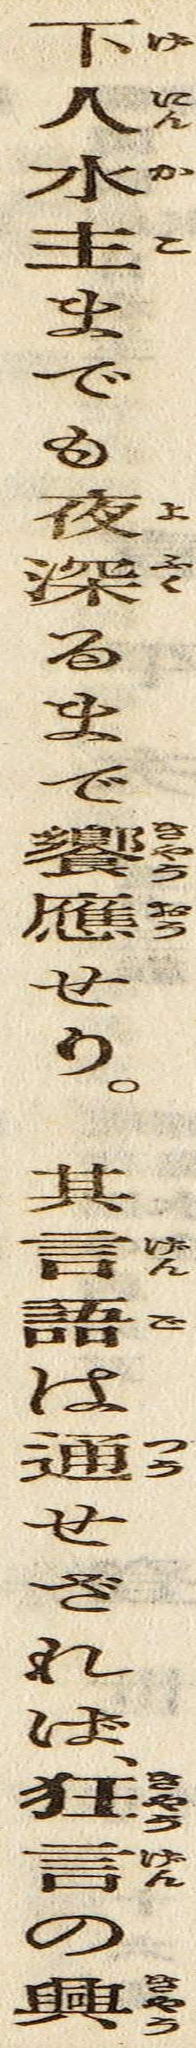下人水主までも夜深るまで饗応せり。其言語通せざれば、狂言の興
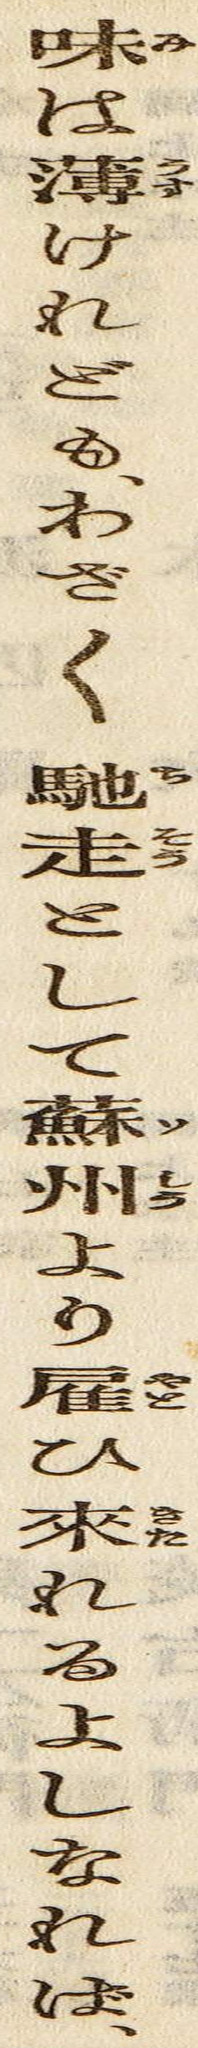味は薄けれども、わざ〳〵馳走として蘇州より雇ひ来れるよしなれば、
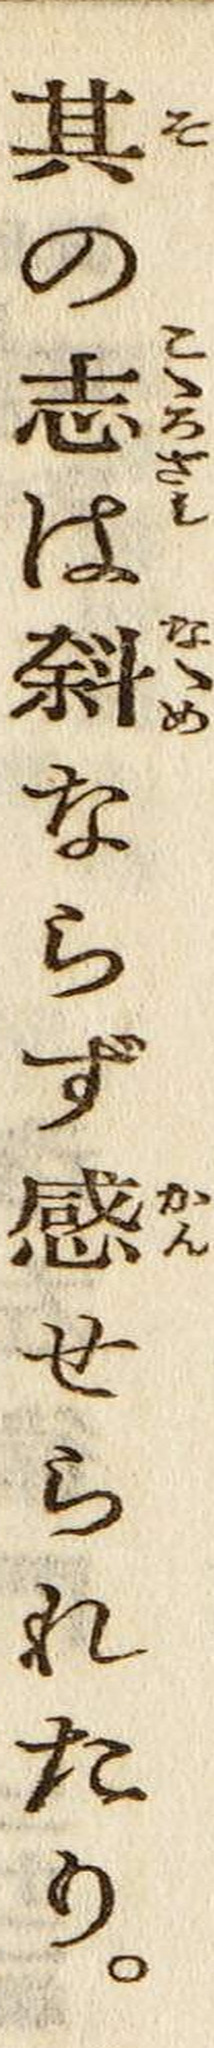其志は斜ならず感せられたり。
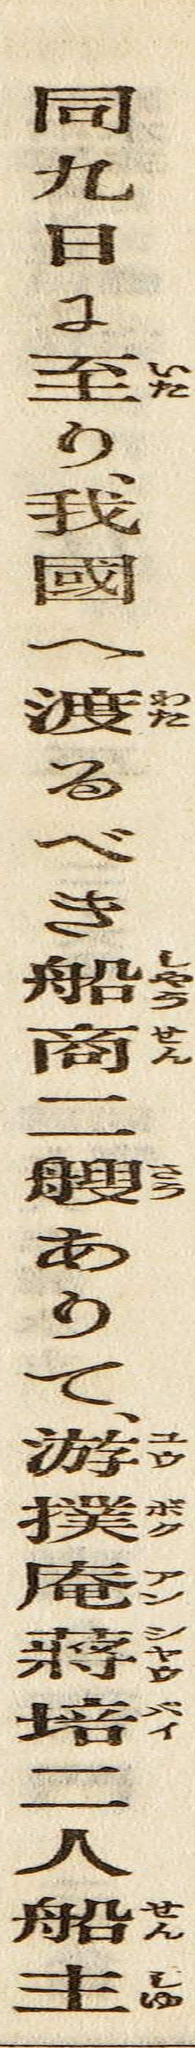同九日に至り、我国へ渡るべき船商二艘ありて游撲庵蒋培二人船主
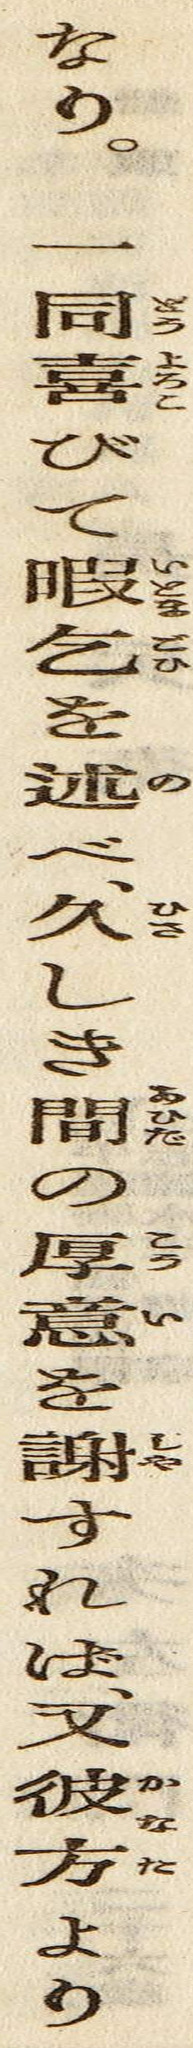なり。一同喜びて暇乞を述べ、久しき間の厚意を謝すれば、又彼方より
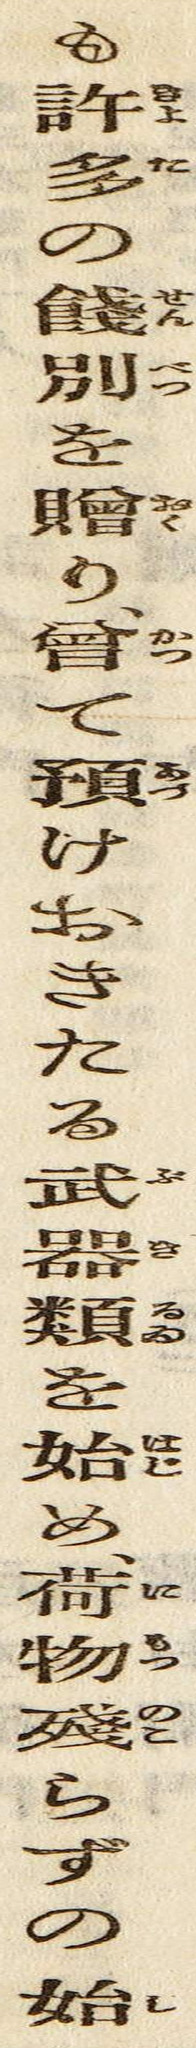も許多の餞別を贈り、嘗て預けおきたる武器類を始め、荷物残らずの始
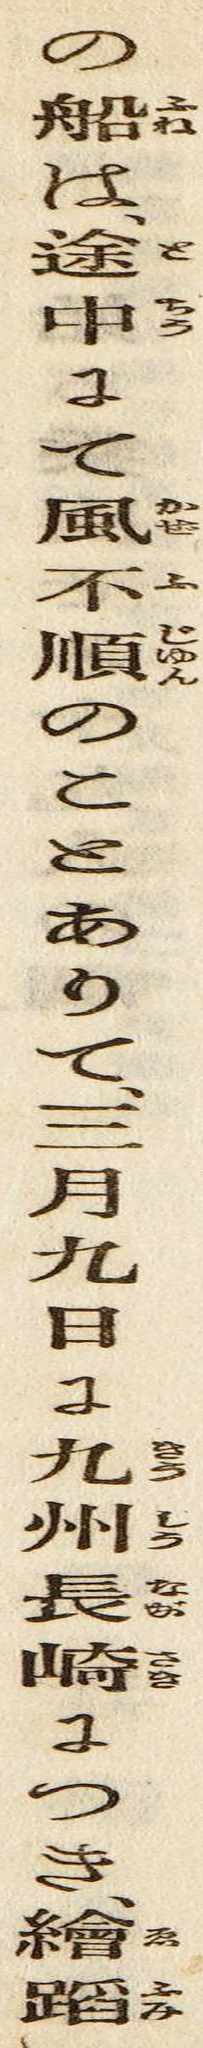の船は、途中にて風不順のことありて三月九日に九州長崎につき、絵踏
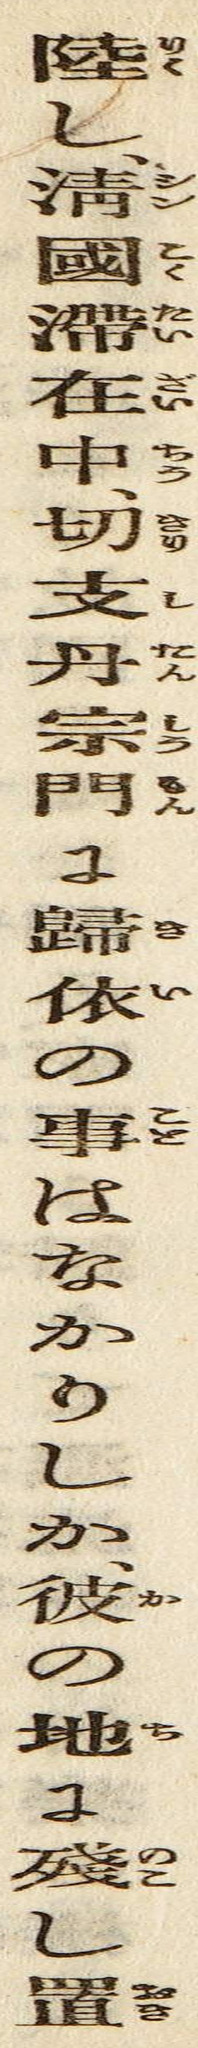陸し、清国滞在中、切支丹宗門に帰依の事はなかりしか、彼の地に残し置

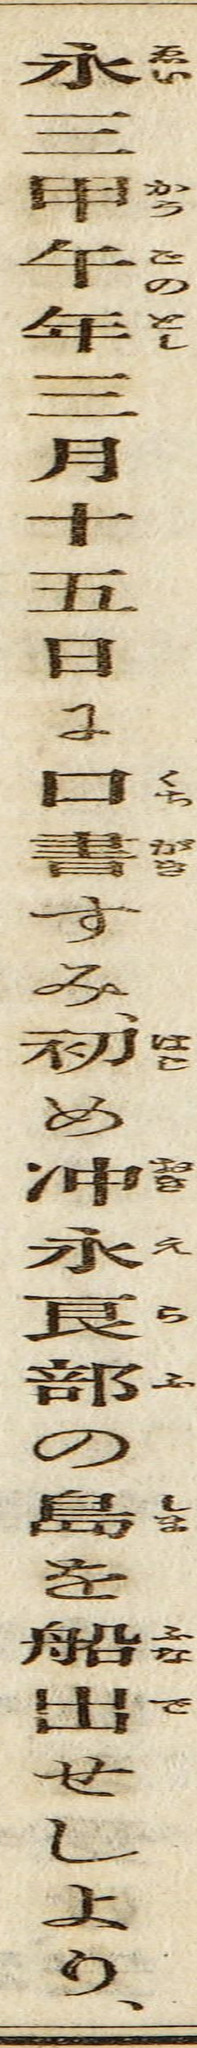永三甲午年三月十五日に口書すみ、初め沖永良部の島を船出せしより、
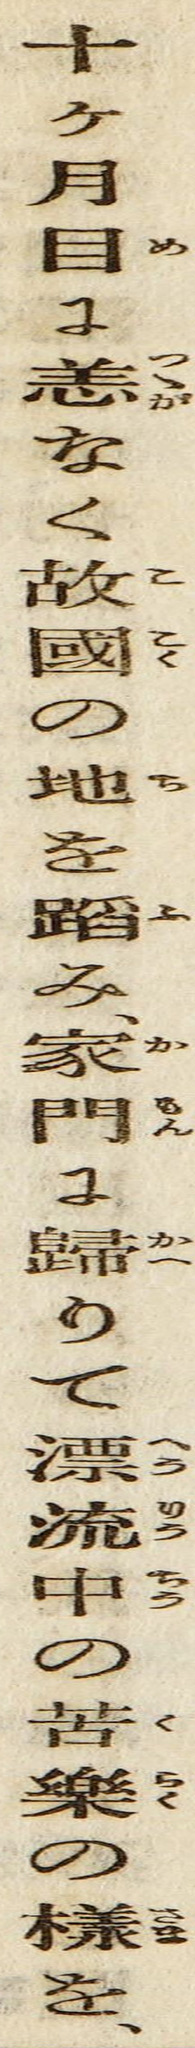十ケ月目に恙なく故国の地を踏み、家門に帰りて漂流中の苦楽の様を、
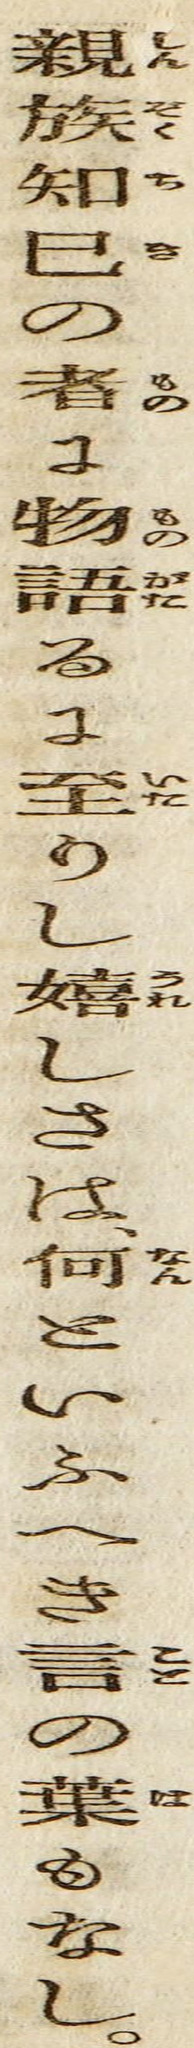親族知己の者に物語るに至りし嬉しさは、何といふへき言の葉もなし。
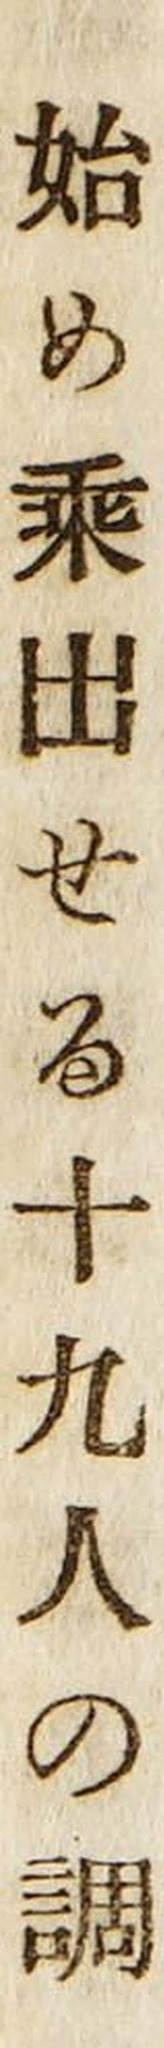始め乗出せる十九人の調
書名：日本漂流譚
